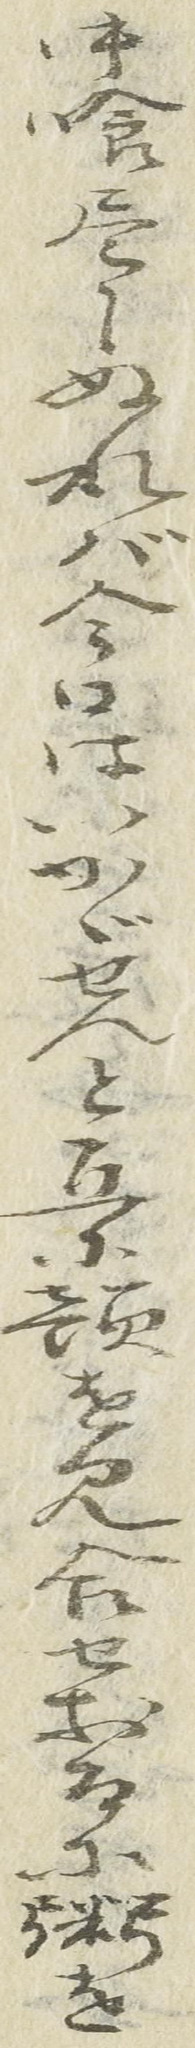中喰尽しぬれバ今日はいかゞせんと互に顔を見合せおるに粥を
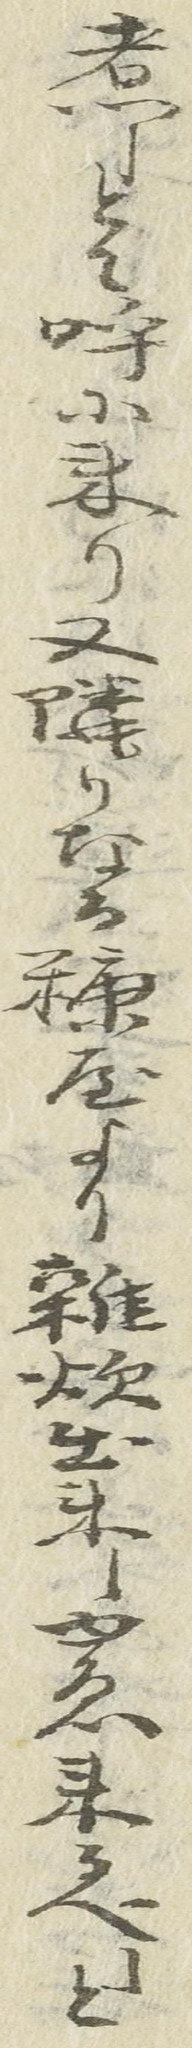煮しとて呼に来り又隣りなる糠屋より雑炊出来しゆゑ来るべしと
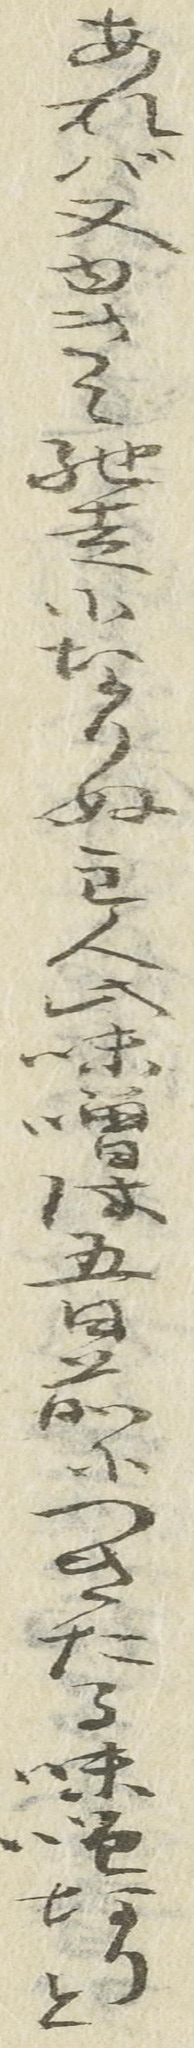あれバ又ゆきて馳走になりぬ主人此味噌は五日前につきたる味噌なりと
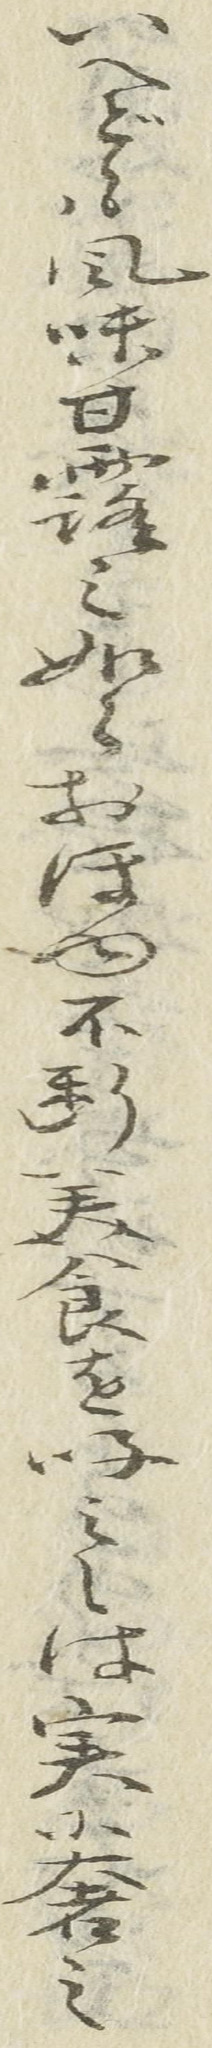いへども風味甘露之如くおほゆ不断美食を好みしは実に奢之
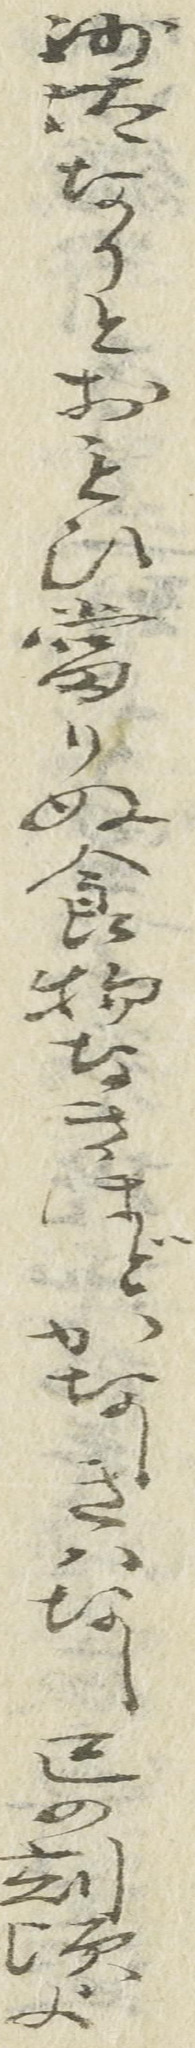沙汰なりとおもひ當りぬ食物なきほどかなしきハなし巳の刻頃よ
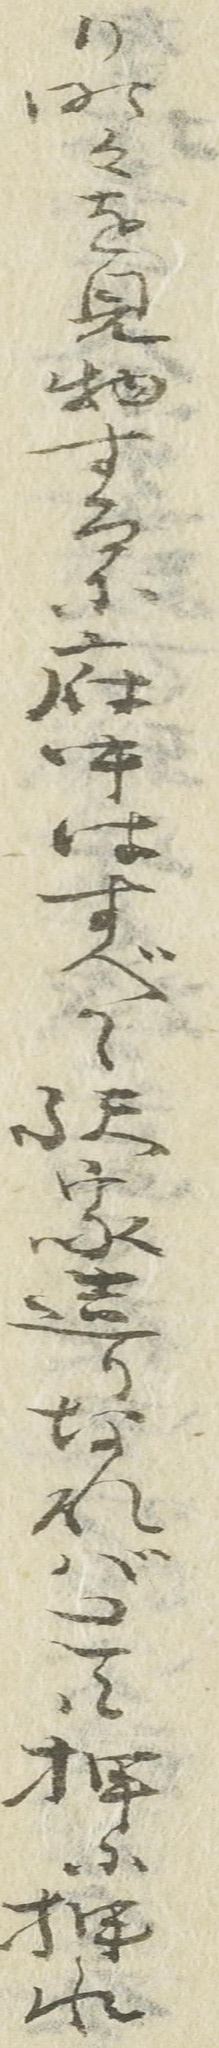り町々を見物するに府中はすべて駅家造りなれバとも押に押れ
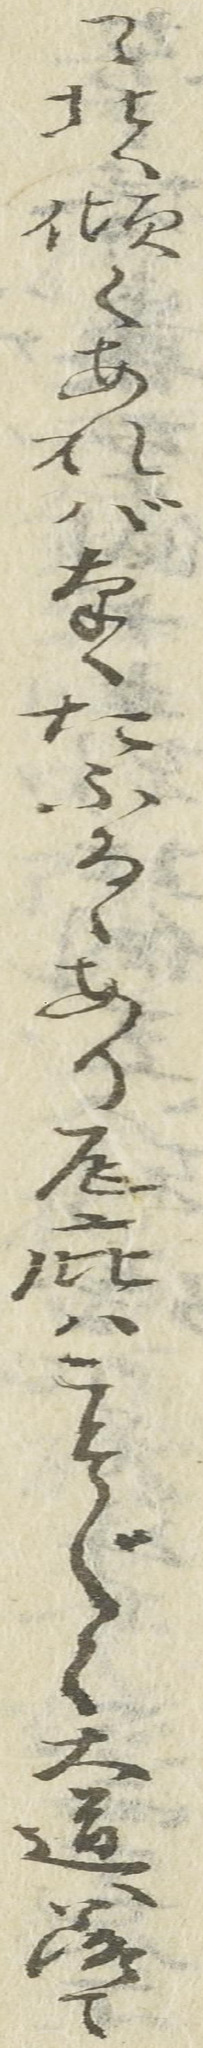て北へ傾くあれバ南へたふるゝあり瓦庇はこと〴〵く大道へ落て
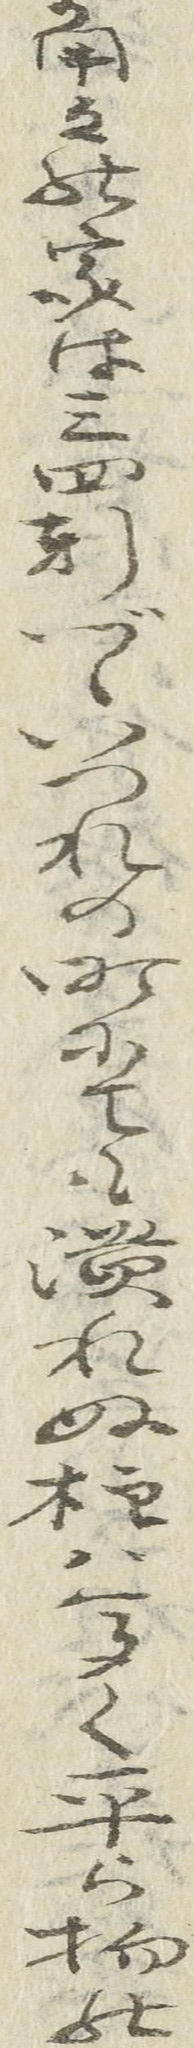角々の家は三四軒づゝいつれの町にても潰れぬ柱ハ多く平ら物の
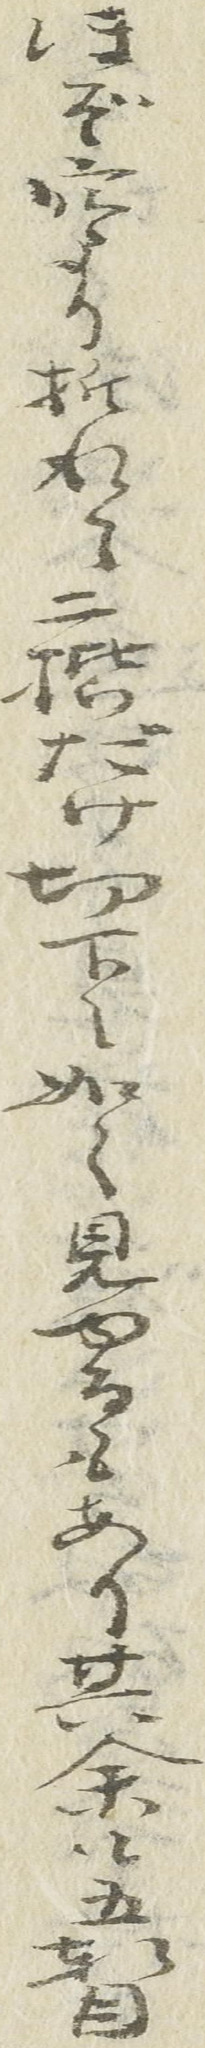ほぞ穴より折れて二階だけ切下し如く見ゆるもあり其余も五軒目
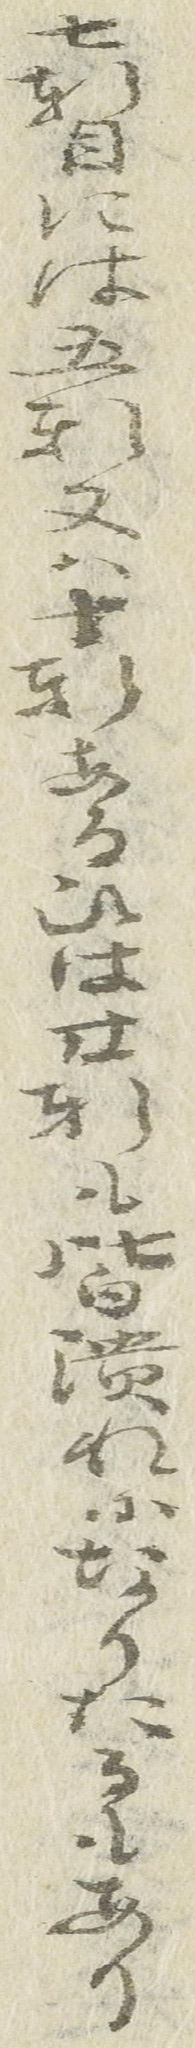七軒目には五軒又ハ十軒あるひは廿軒も皆潰れになりたるもあり
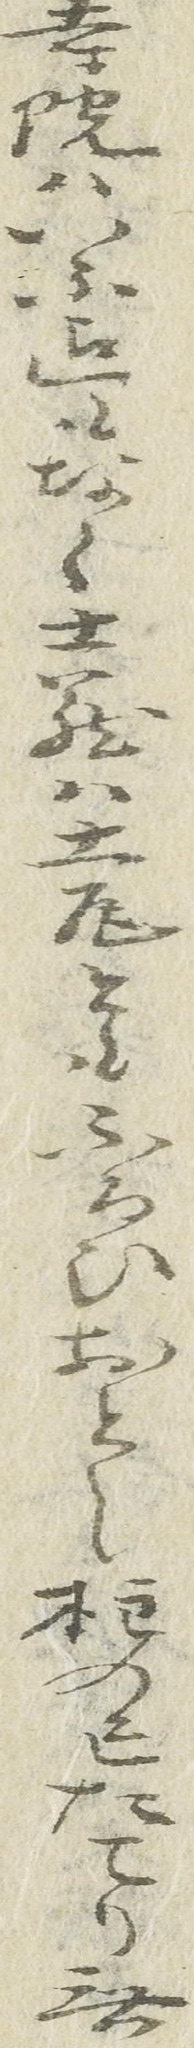寺院ハいふ迄もなく土蔵ハ土瓦ともふるひおとし柱のみたてり無
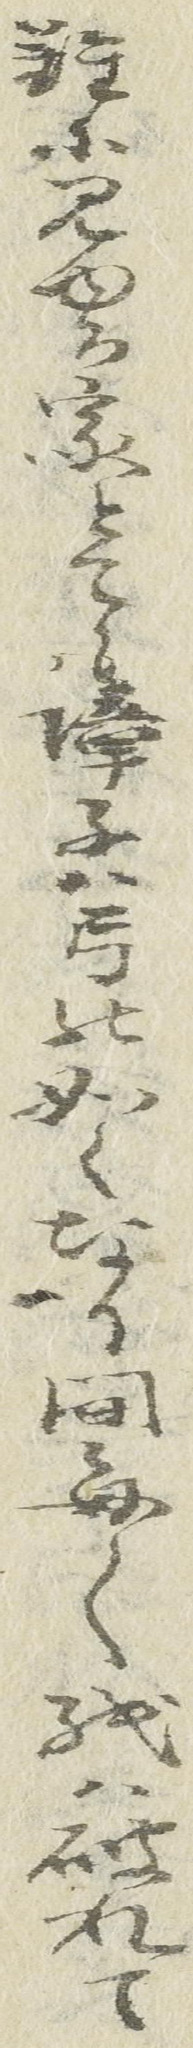難に見ゆる家とても障子ハ弓の如くなり間毎〳〵紙は破れて
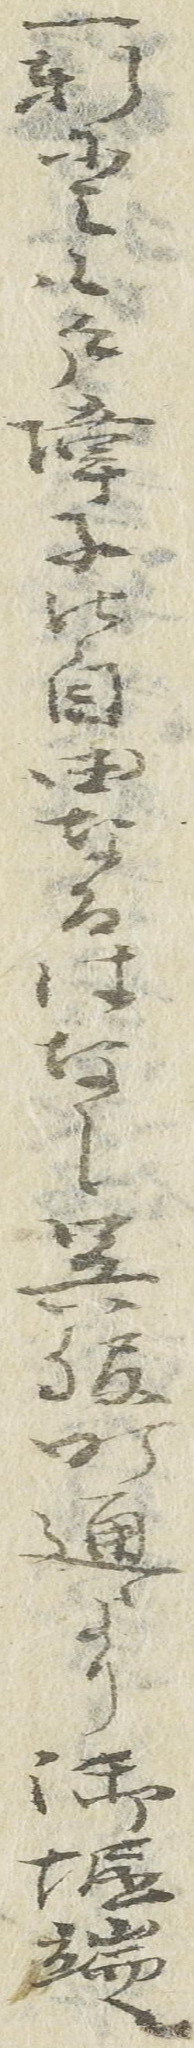一軒少しも戸障子の自由なるはなし呉服町通より御堀端へ
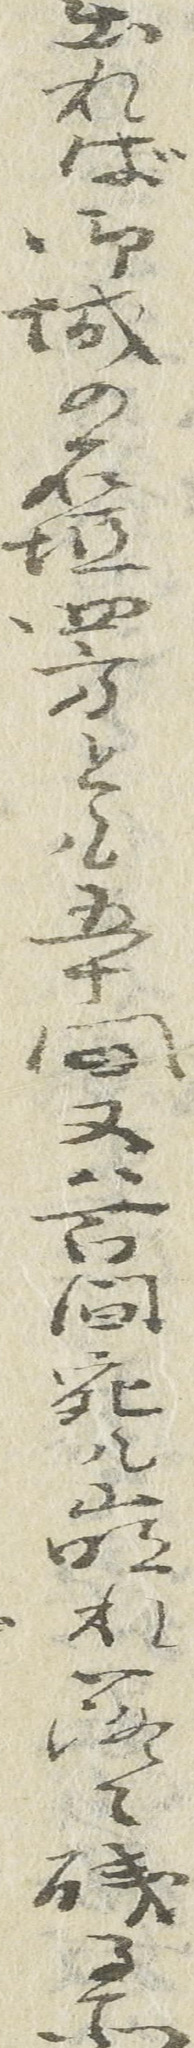出れば御城の石垣四方とも五十間又ハ百間宛も崩れ落て残る所
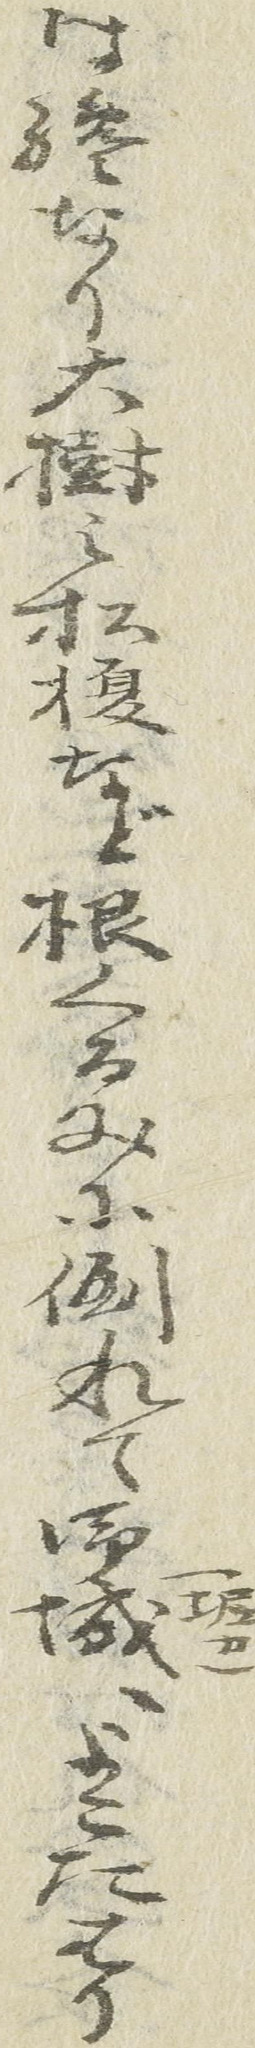は纔なり大樹之松榎など根くるみに倒れて御城へよこたはり
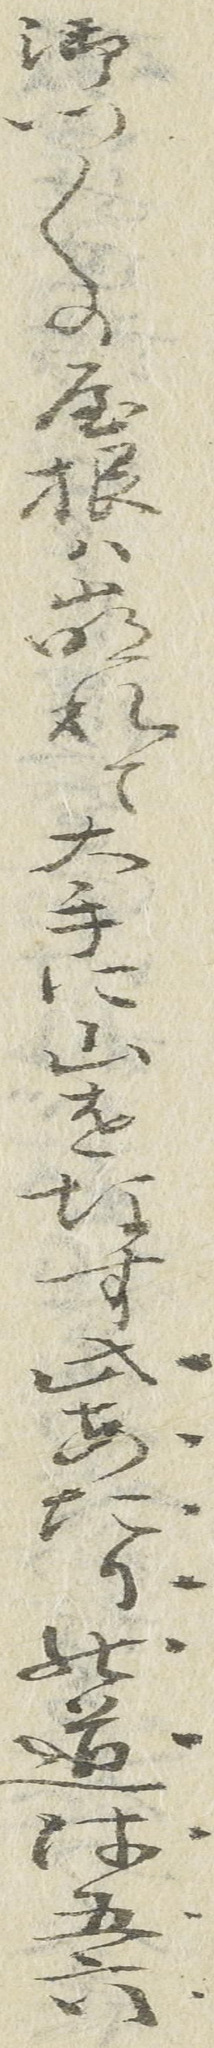御門〳〵の屋根ハ崩れて大手に山をなす此あたりの道は五六
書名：地震前兆集　全
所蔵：東京大学地震研究所図書室 Earthquake Research Institute Library, The University of Tokyo, JAPAN
